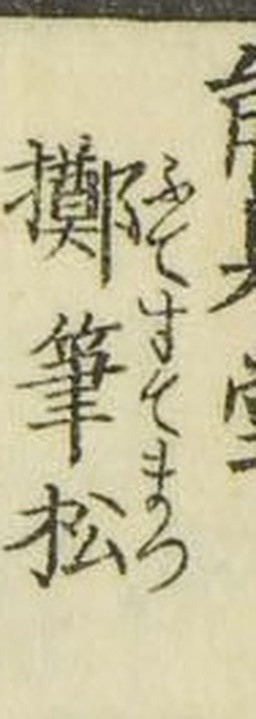擲筆松
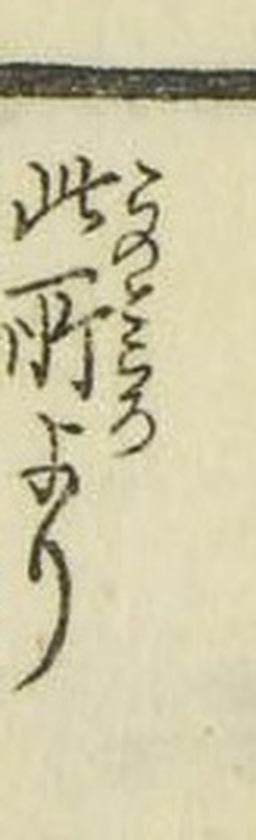此所より
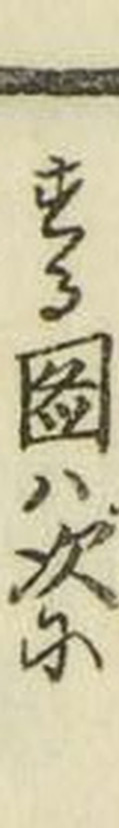する圖は次に
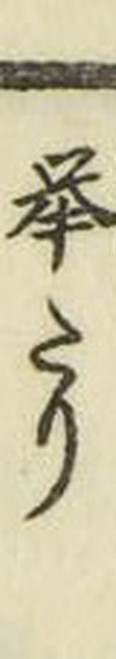挙たり

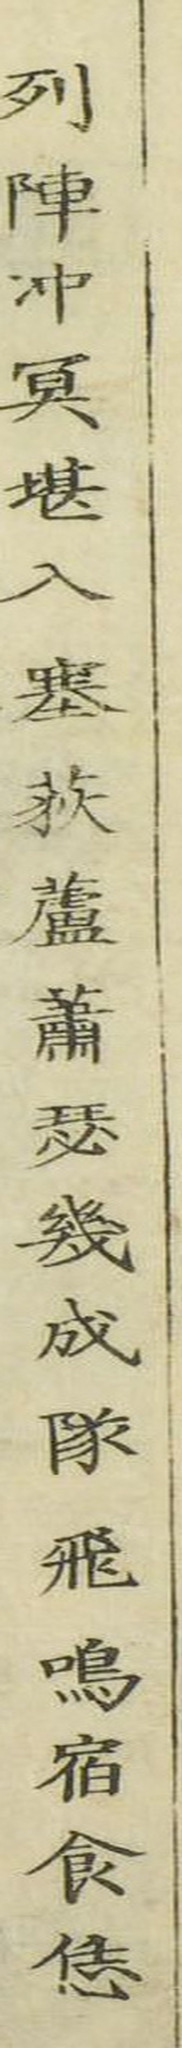列陣冲冥堪入塞荻蘆蕭瑟幾成隊飛鳴宿食恁
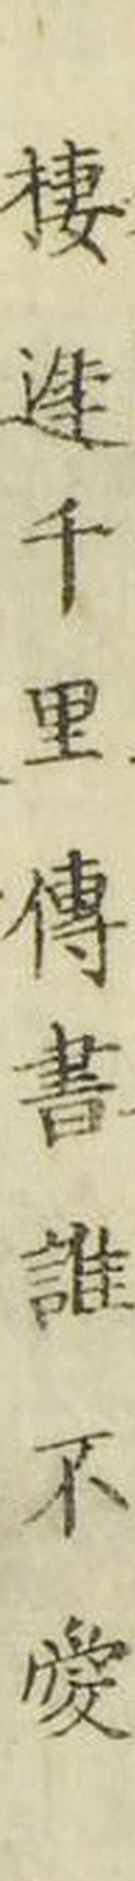棲遅千里傳書誰不愛
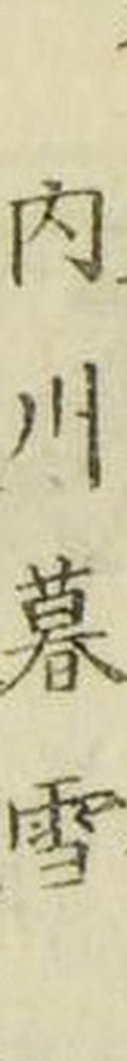内川暮雪
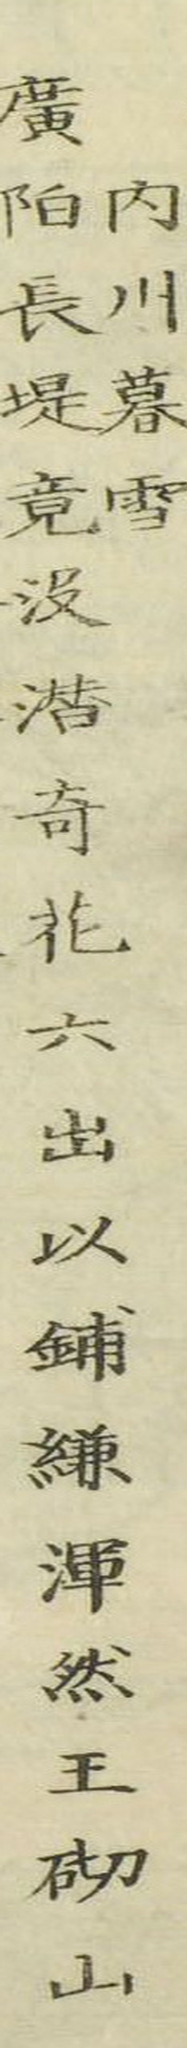廣陌長堤竟没潜奇花六出以鋪縑渾然王砌山
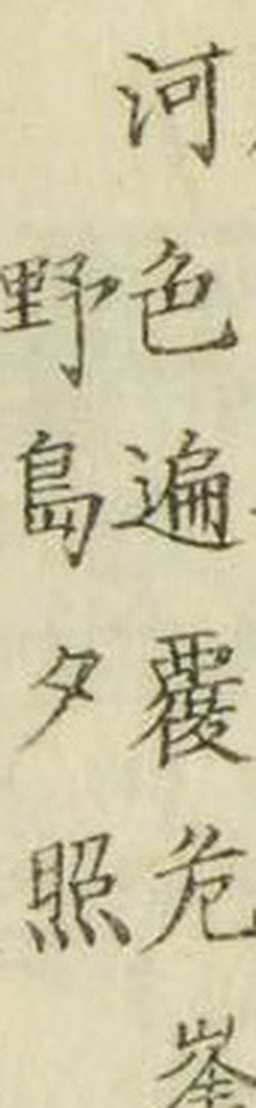野島夕照
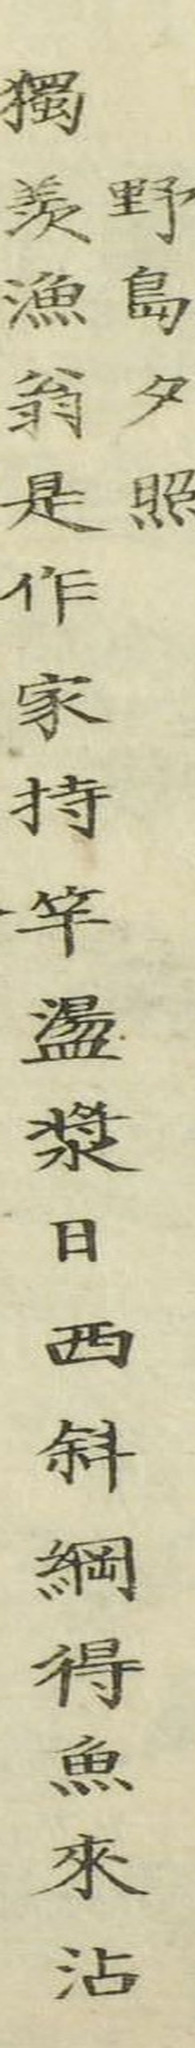獨羨漁翁是作家持竿盪漿日西斜綱得魚來沾
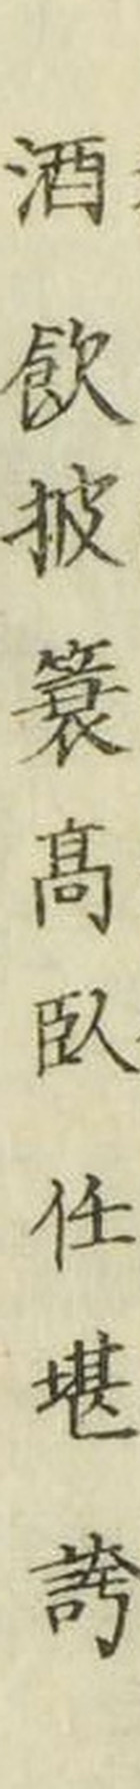酒飲披簑髙臥任堪誇
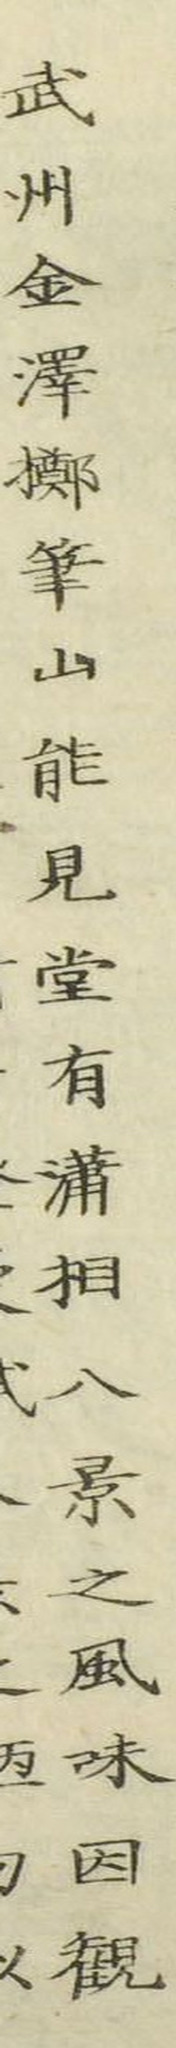武州金澤擲筆山能見堂有瀟相八景之風味因観
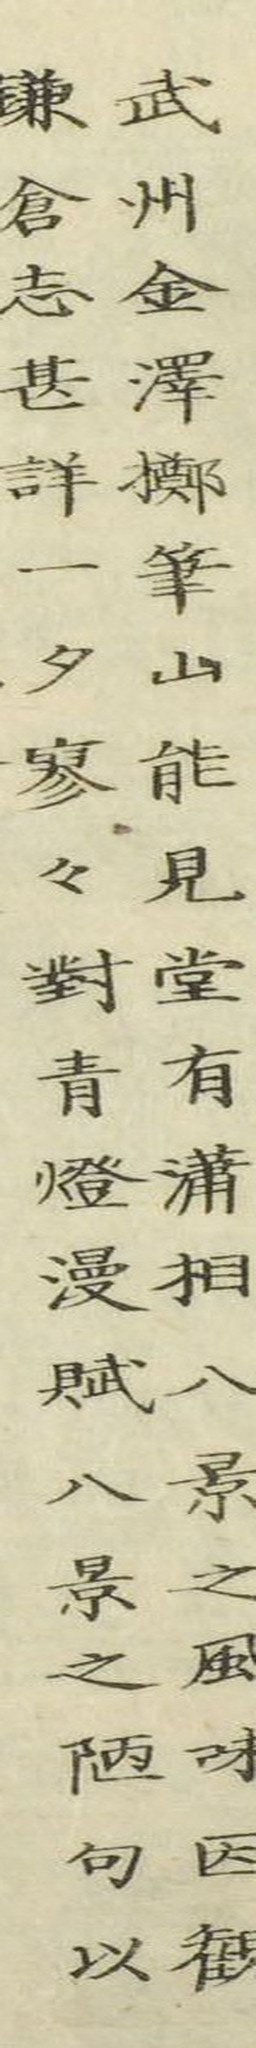鎌倉志甚詳一夕寥々對青燈漫賦八景之陋句以
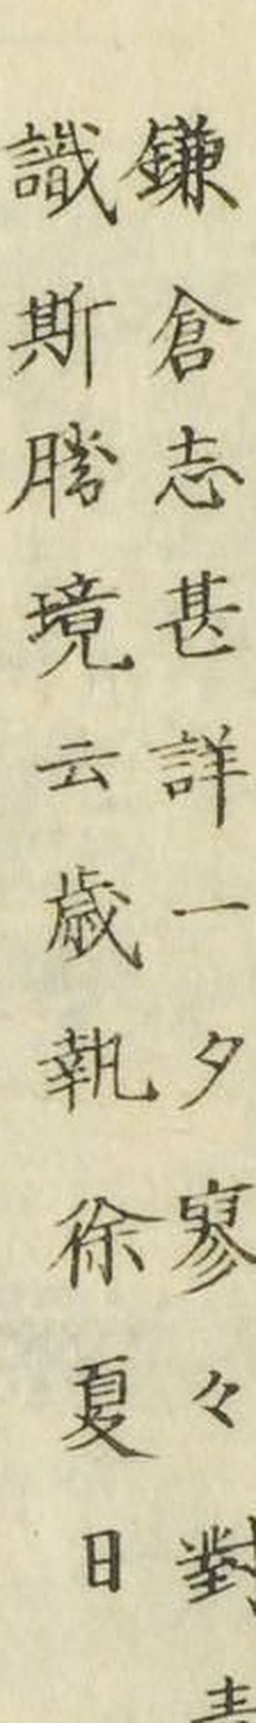識斯勝境云歳執徐夏日
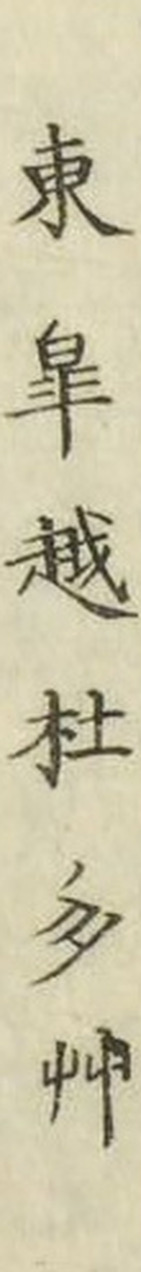東皐越杜多艸
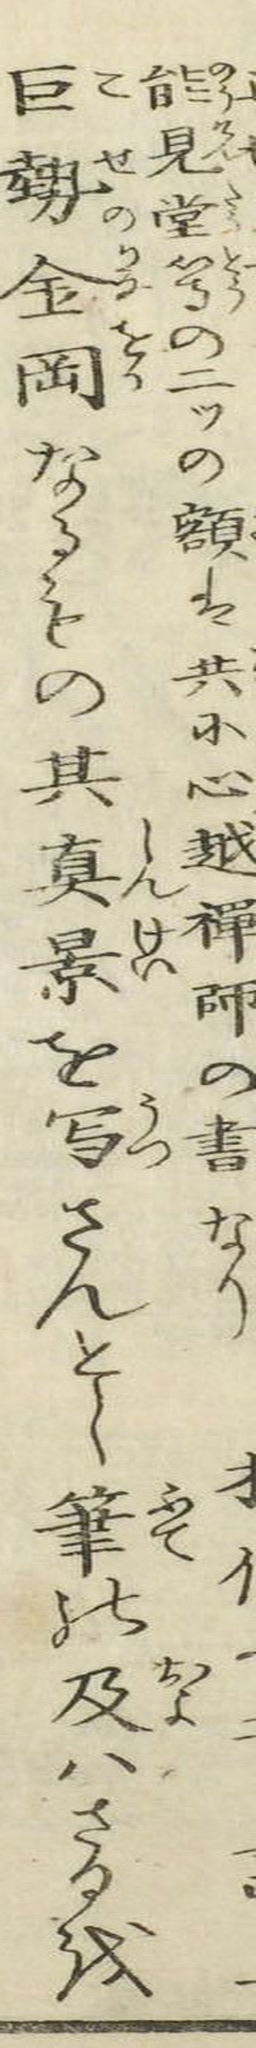巨勢金岡なるもの其真景を写さんとし筆の及はさるを
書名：江戸名所図会 20巻 巻之6
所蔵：東京学芸大学教育コンテンツアーカイブ
